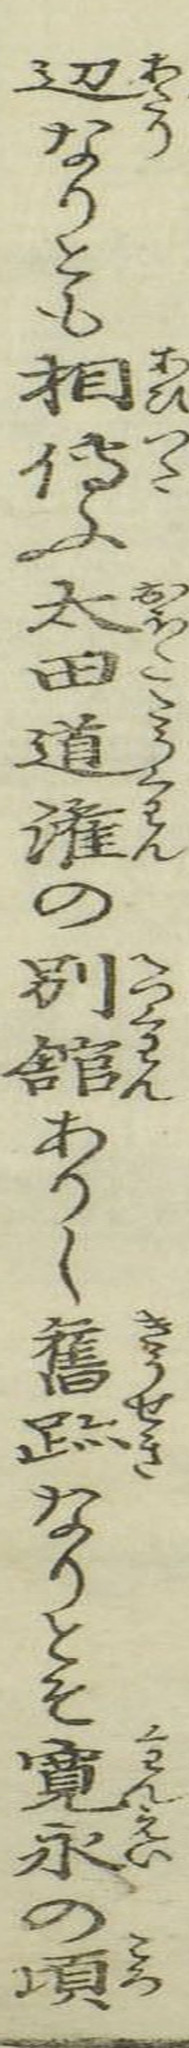辺なりとも相伝ふ太田道灌の別館ありし旧跡なりとそ寛永の頃

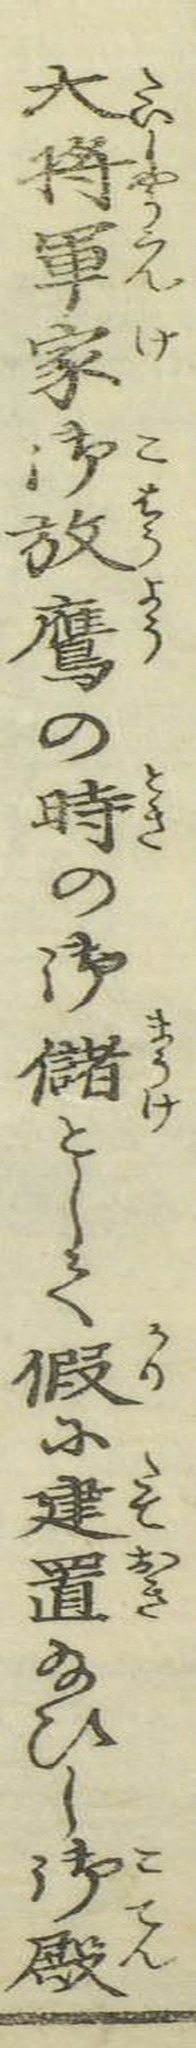大将軍家御放鷹の時の御儲として仮に建置給ひし御殿
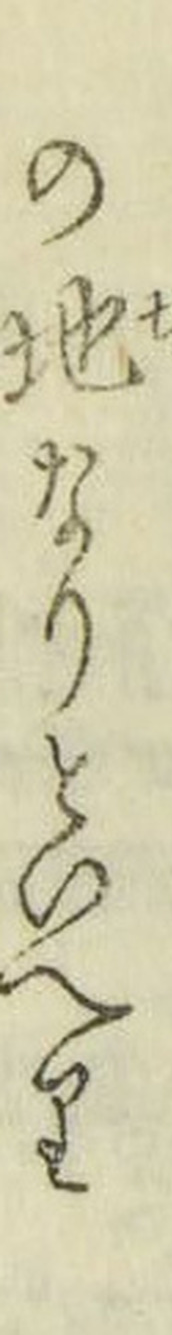の地なりといへり
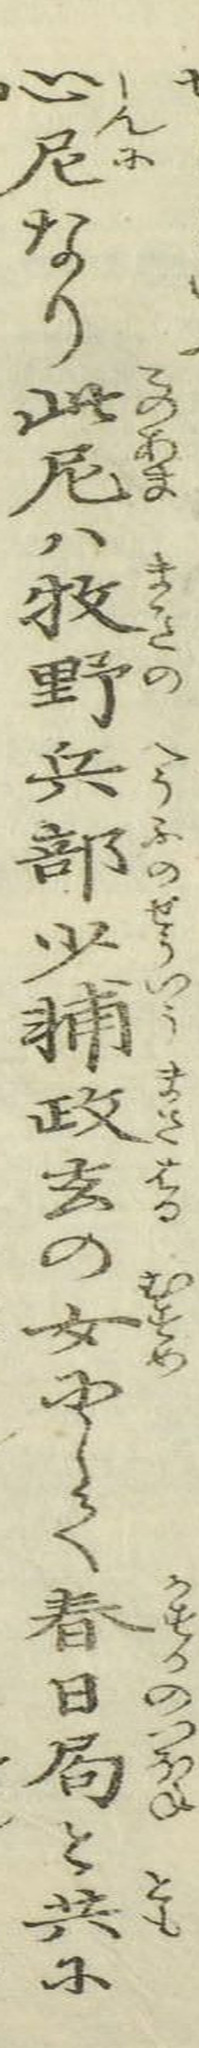心尼なり此尼は牧野兵部少輔政玄の女にして春日局と共に
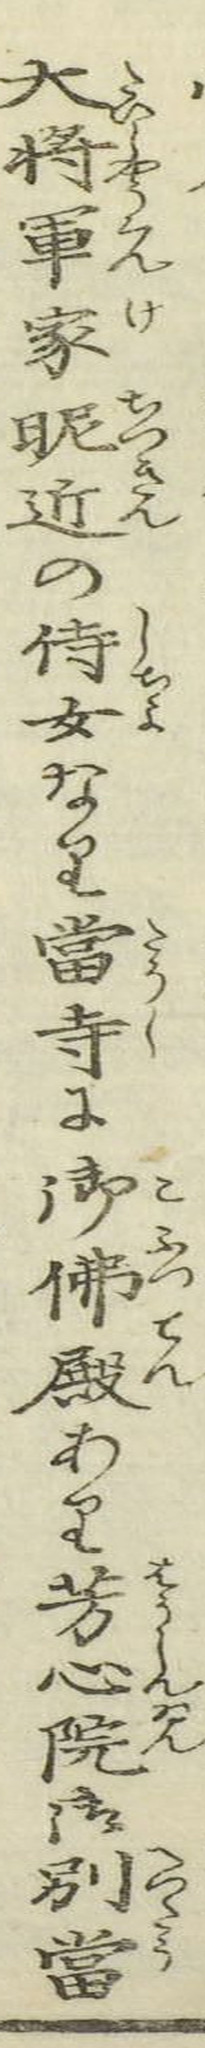大将軍家昵近の侍女なり当寺に御仏殿あり芳心院御別当
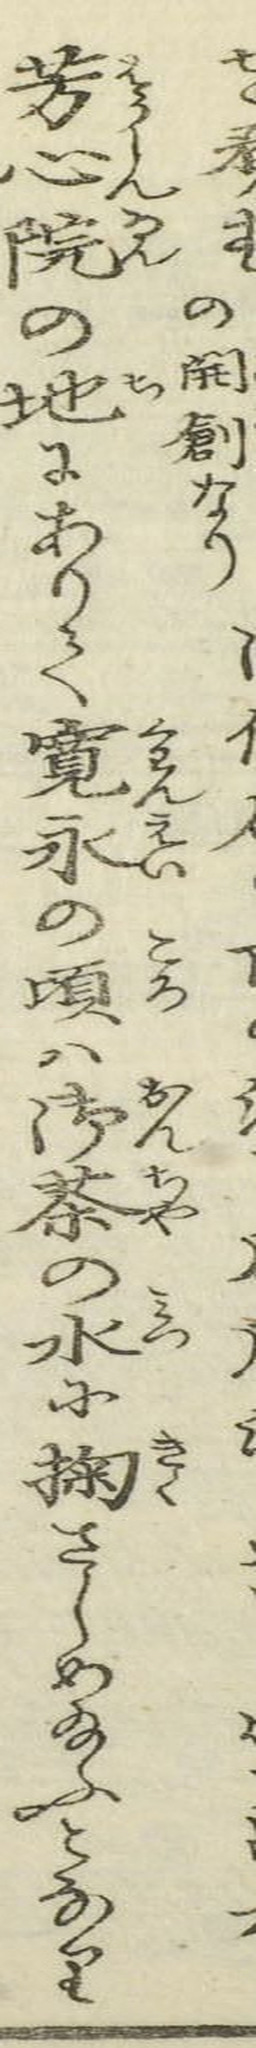芳心院の地にありて寛永の頃は御茶の水に掬さしめ給ふとなり
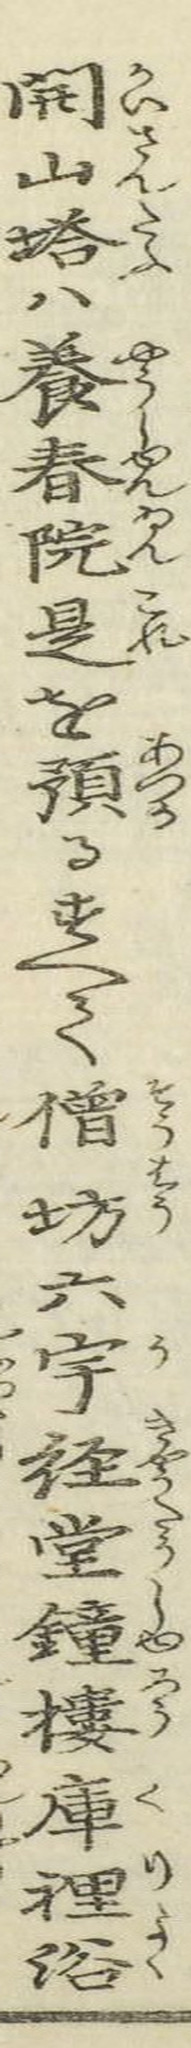開山塔は養春院是を預るすへて僧坊六宇経堂鐘楼庫裡浴
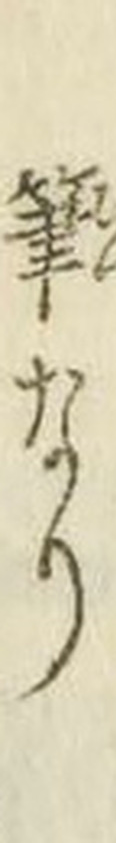筆なり
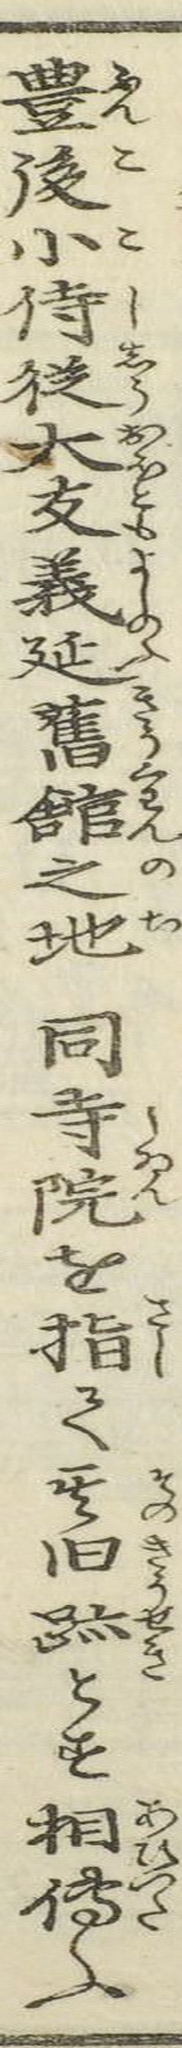豊後小侍従大友義延旧館之地同寺院を指て其旧跡とす相伝ふ
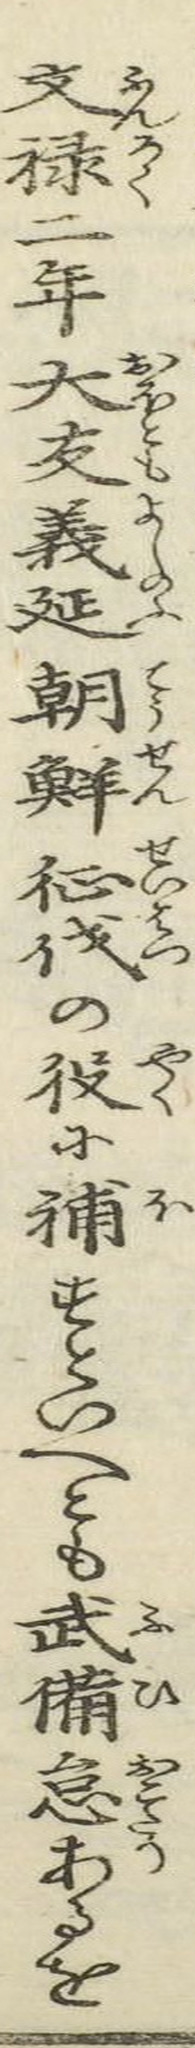文禄二年大友義延朝鮮征伐の役に補すといへとも武備怠あるを
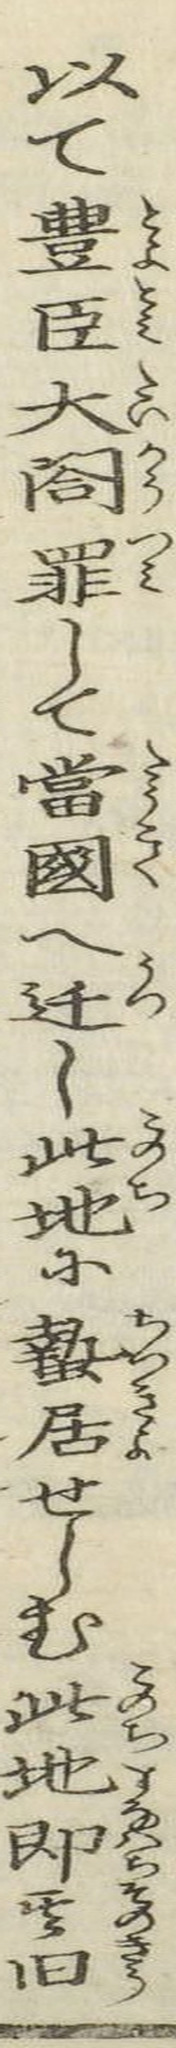以て豊臣大閤罪して当国へ遷し此地に蟄居せしむ此地即其旧
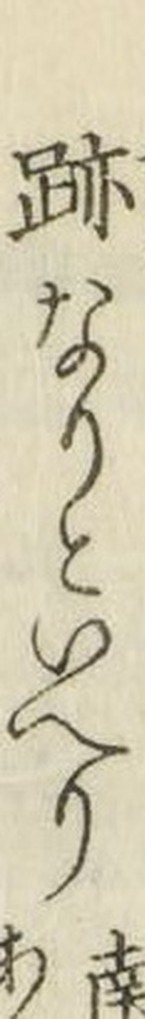の地なりといへり
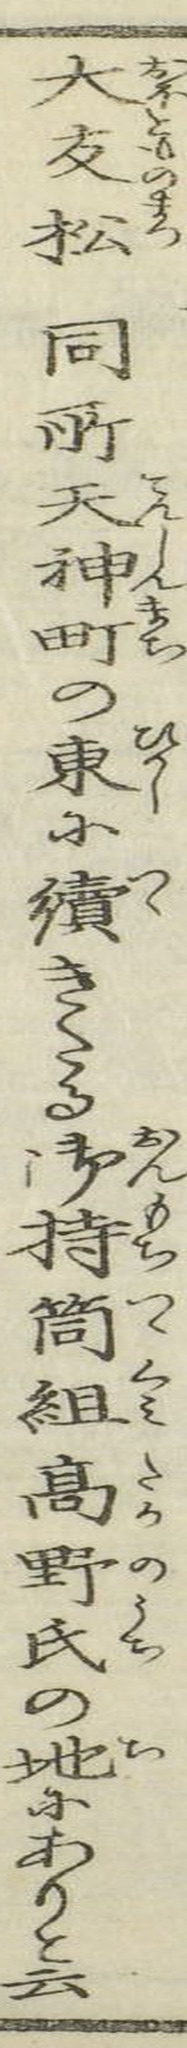大友松同所天神町の東に続きたる御持筒組高野氏の地にありと云
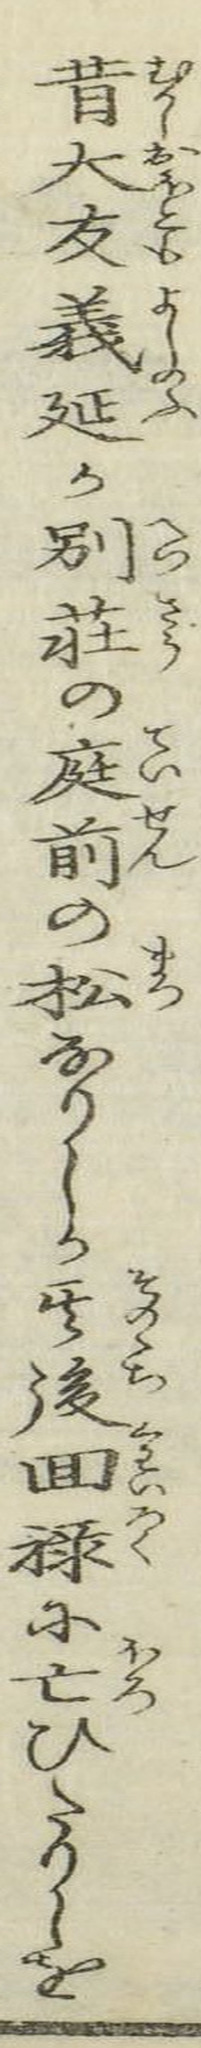昔大友義延か別荘の庭前の松なりしか其後回録に亡ひたりしを
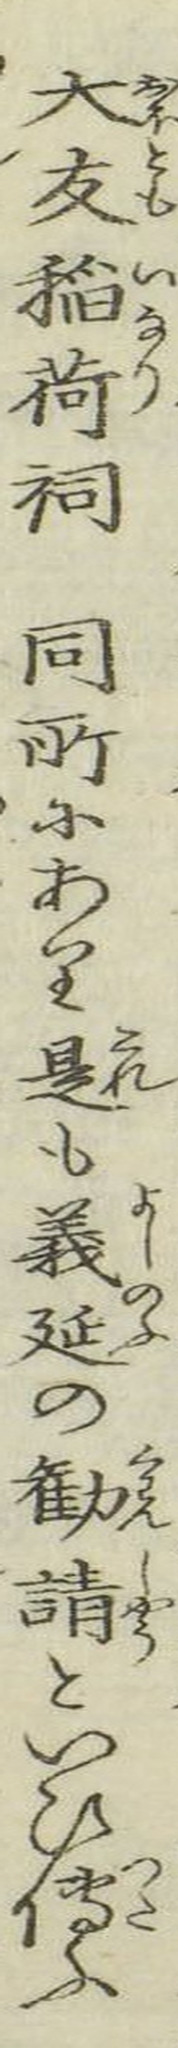大友稲荷祠同所にあり是も義延の勧請といひ伝ふ
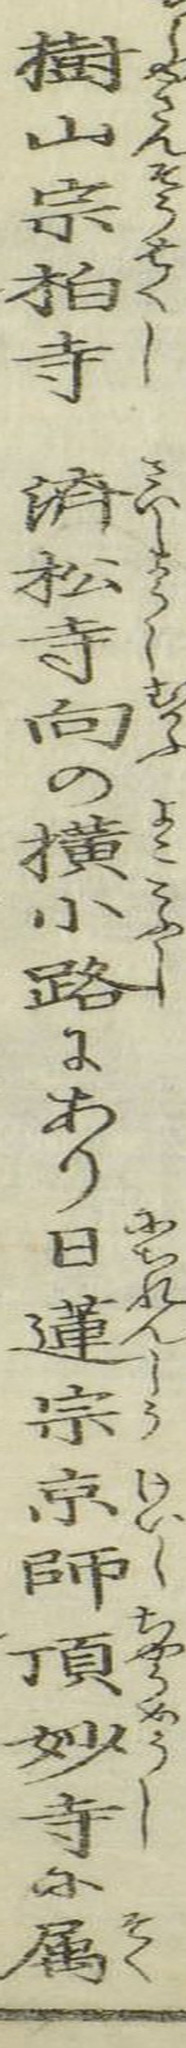一樹山宗柏寺済松寺向の横小路にあり日蓮宗京師頂妙寺に属
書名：江戸名所図会 20巻 巻之11
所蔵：東京学芸大学教育コンテンツアーカイブ
